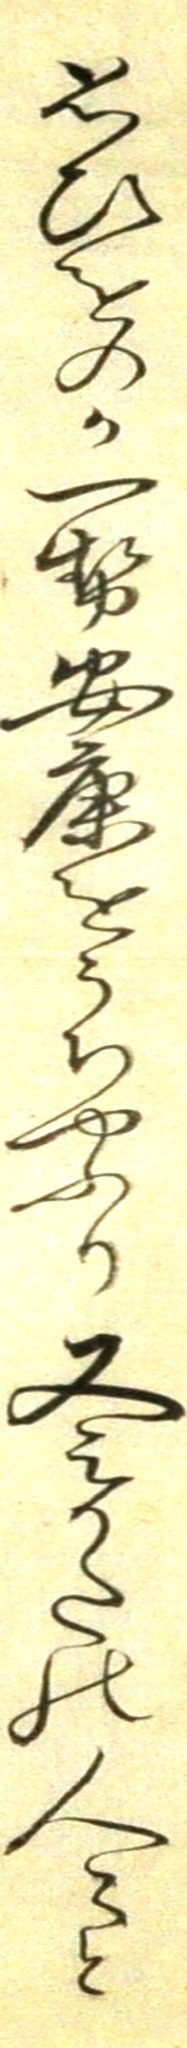思ひをのか一勢安康をうちやふり又みかたの人々と
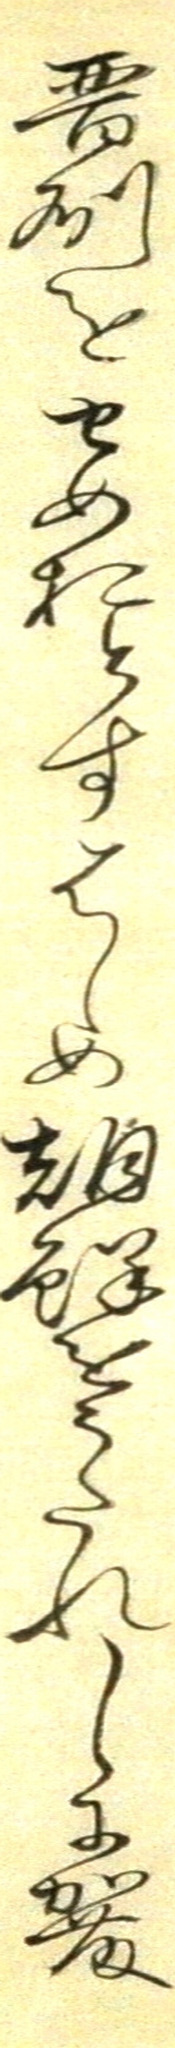晋州をせめおとすはしめ朝鮮をうたれしに加藤
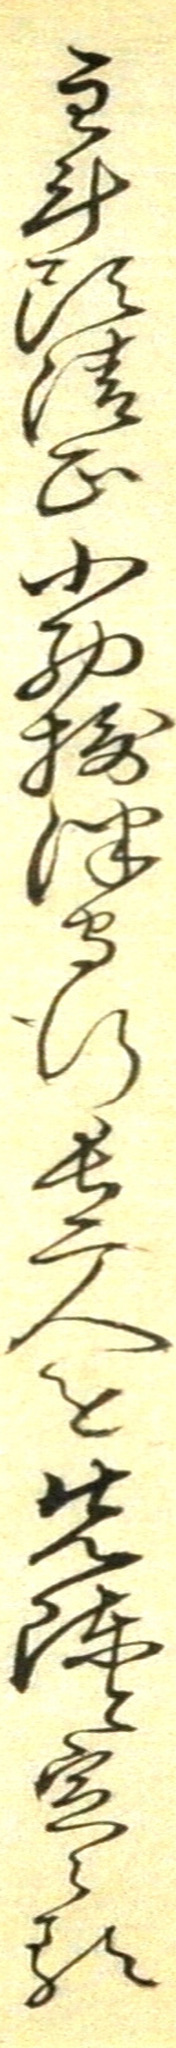主計頭清正小西摂津守行長二人を先陣と定らる
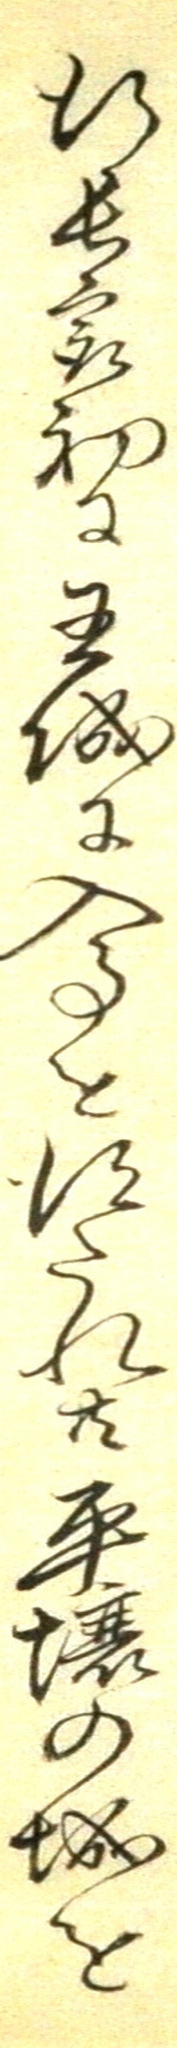行長最初に王城に入事を得たれ共平壌の城を
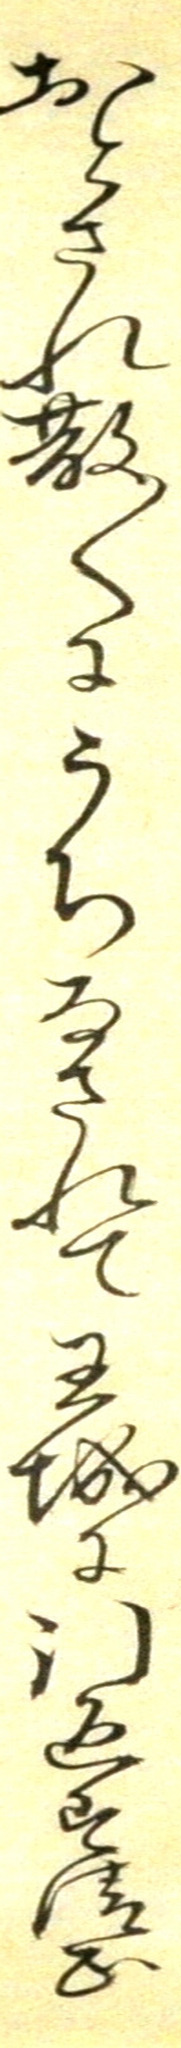おとされ散〳〵にうちなされて王城に引返す清正
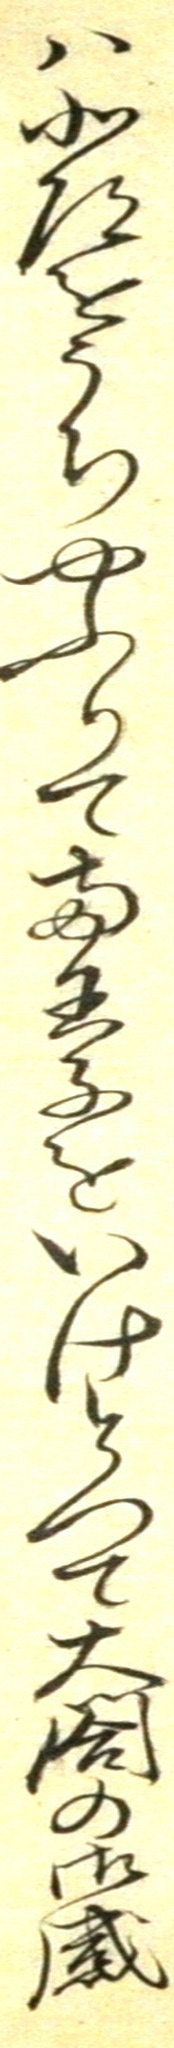は北道をうちやふりて両王子をいけとつて太閤の御威
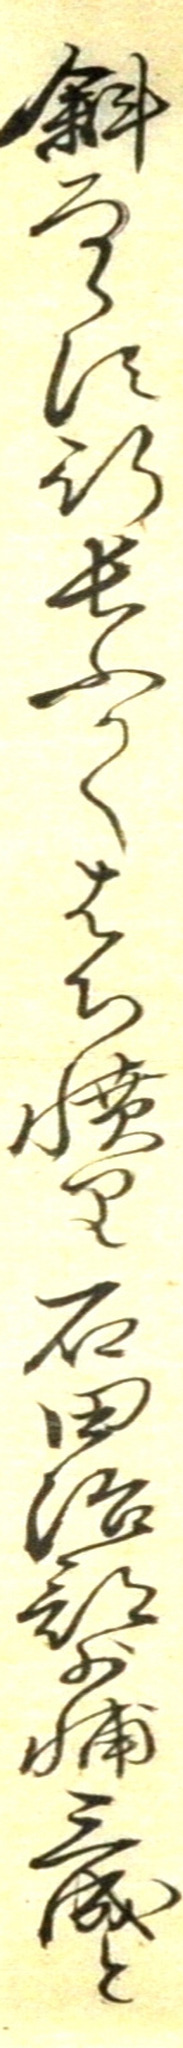斜ならす行長ふふかくはち憤り石田治部少輔三成と
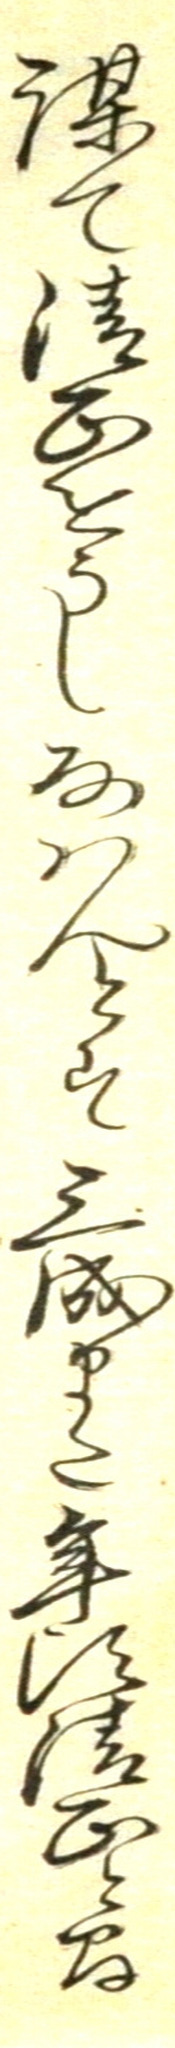謀て清正をうしなはんとす三成また年頭清正と間
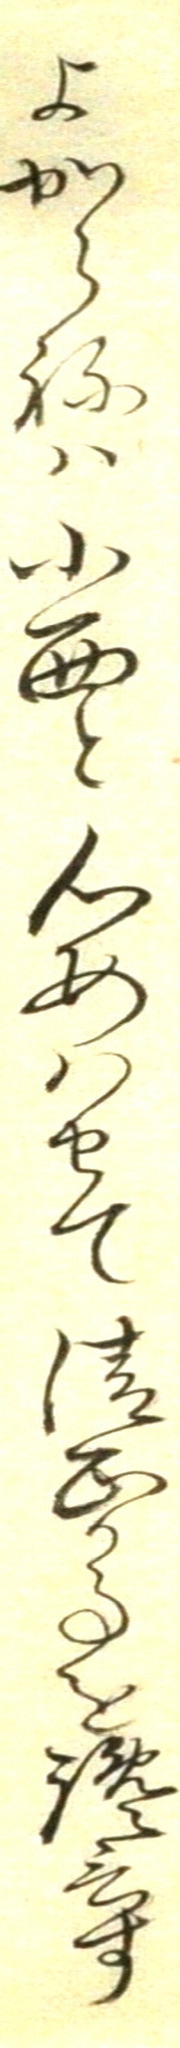よからねは小西と心あはせて清正か事を讒言す
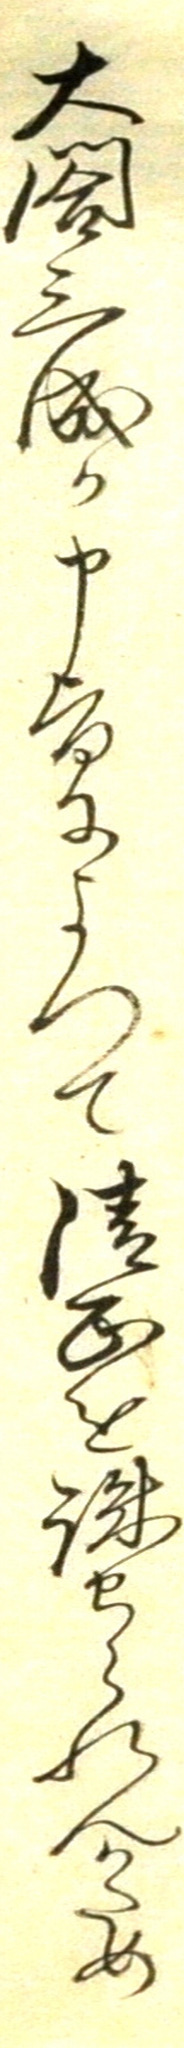太閤三成か申旨によつて清正を誅せられんかため
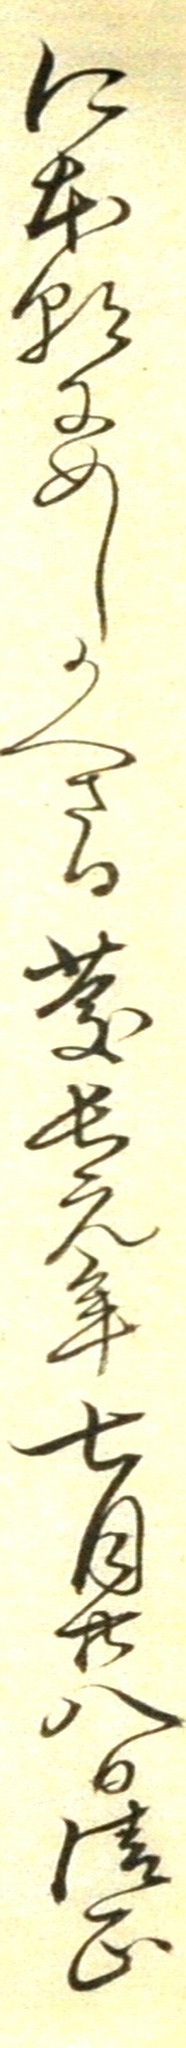に本朝にめしかへさる慶長元年七月廿八日清正
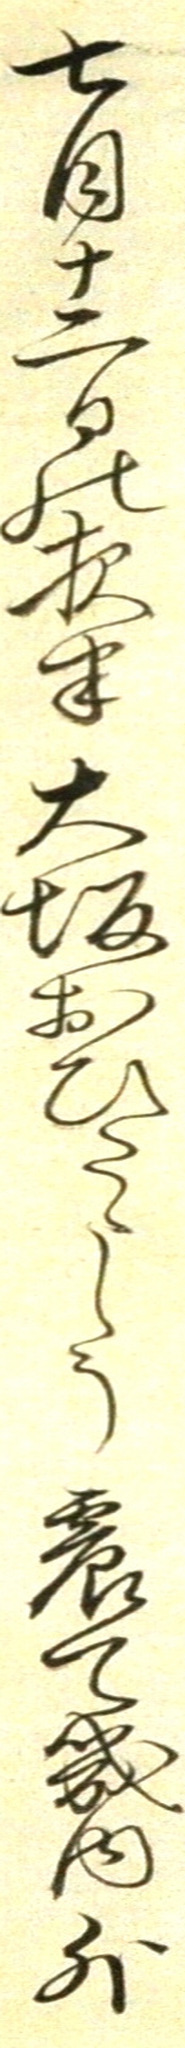七月十二日の夜半大坂おひたゝしう震て畿内外
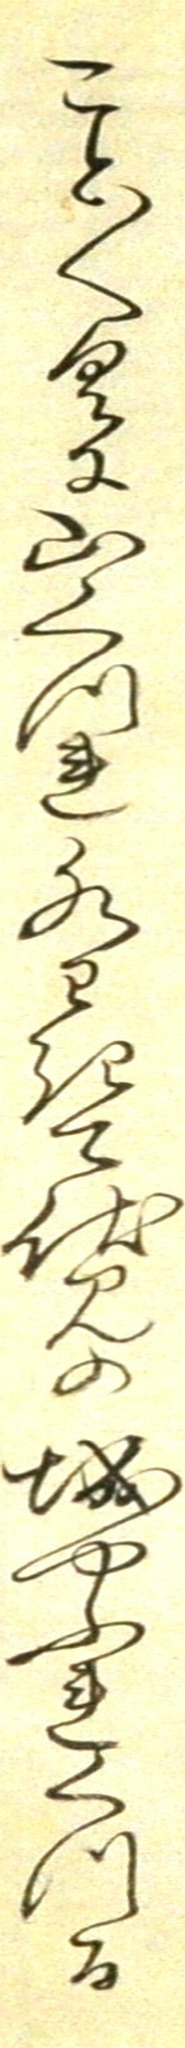こと〳〵くに山くつれ水わきて伏見の城やふれくつる
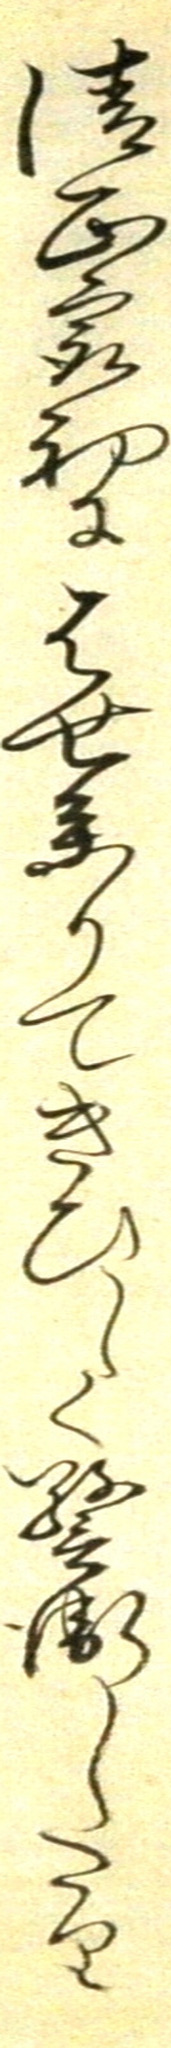清正最初にはせ参りてきひしく警衛したり
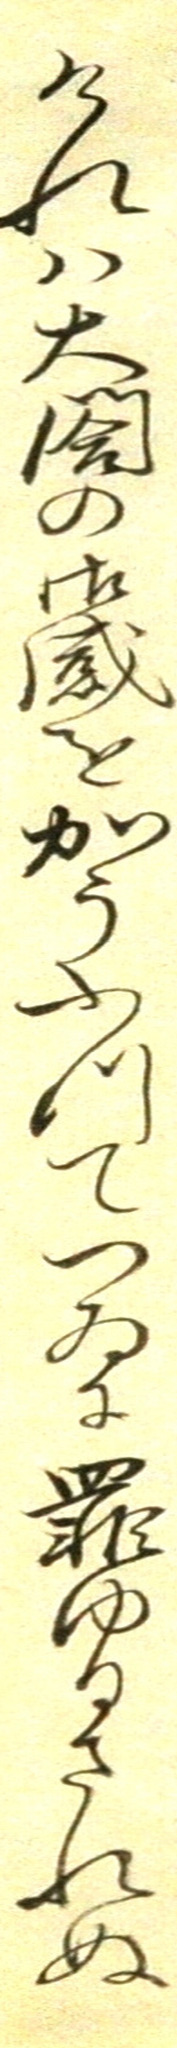けれは太閤の御威をかうふつてつゐに罪ゆるされぬ
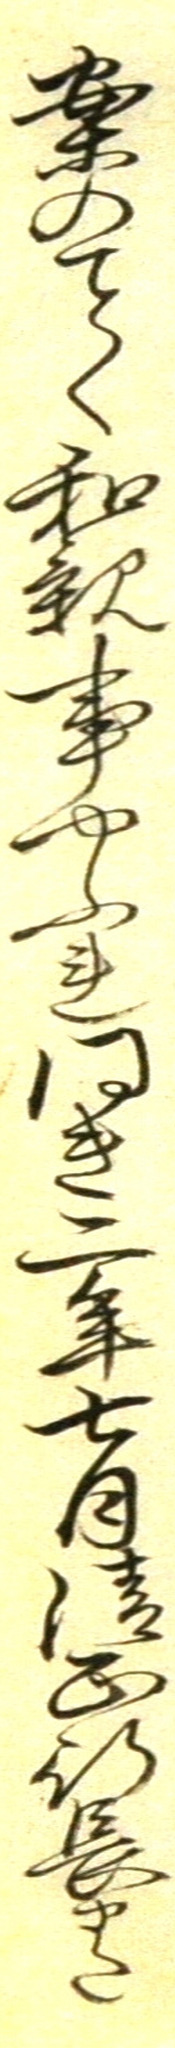案のことく和親事やふれ同き二年七月清正行長また
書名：藩翰譜（十二・上）
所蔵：伊那市立高遠町図書館・合同会社AMANE
